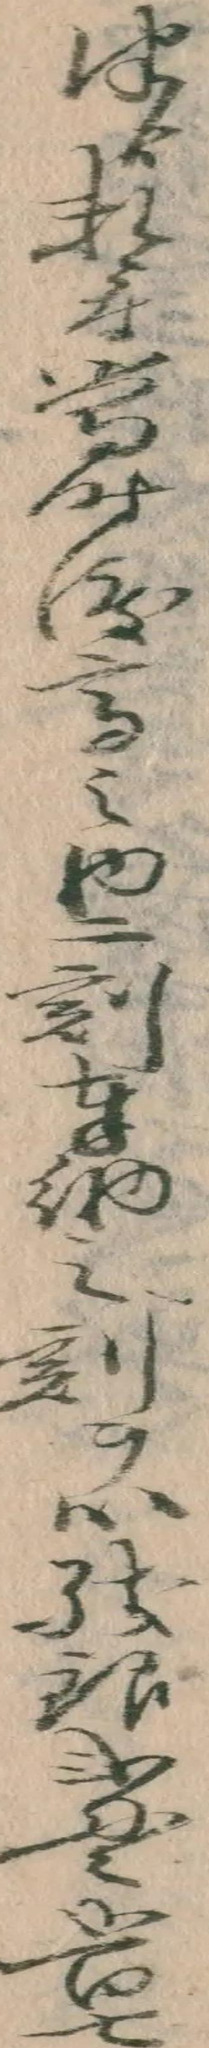津ゟ頼ニ付當時渡高之内二割奉納之割ヲ以残銀弐貫弐百七
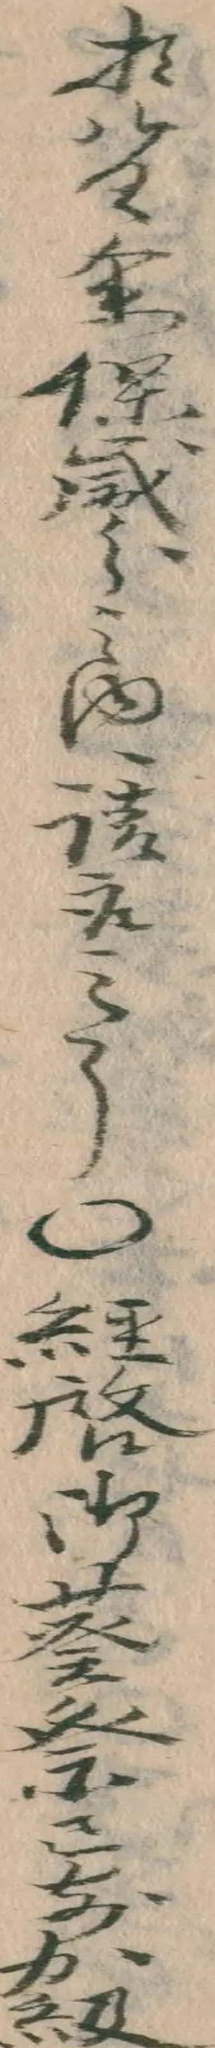拾鉢匁余保歳分之内ニ請取之了○経啓御葵祭已前加級
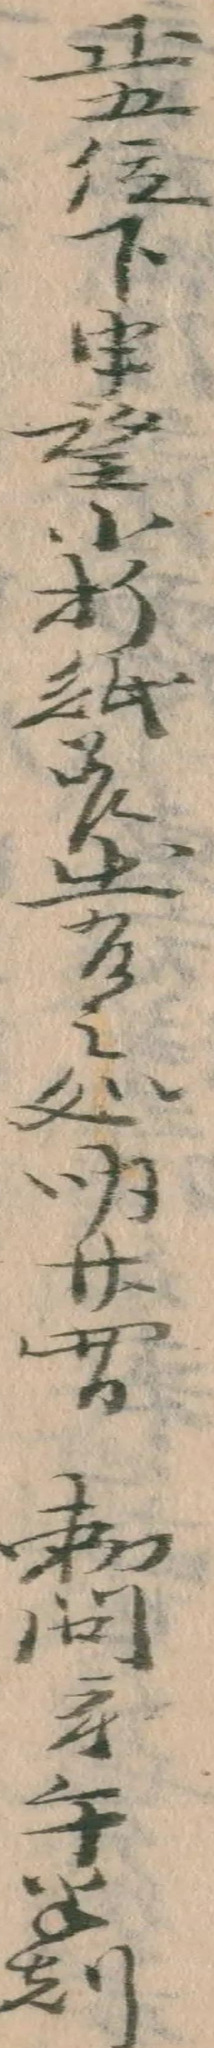正五位下申望小折紙差出有之処明廿四日勅問ニ付午半刻
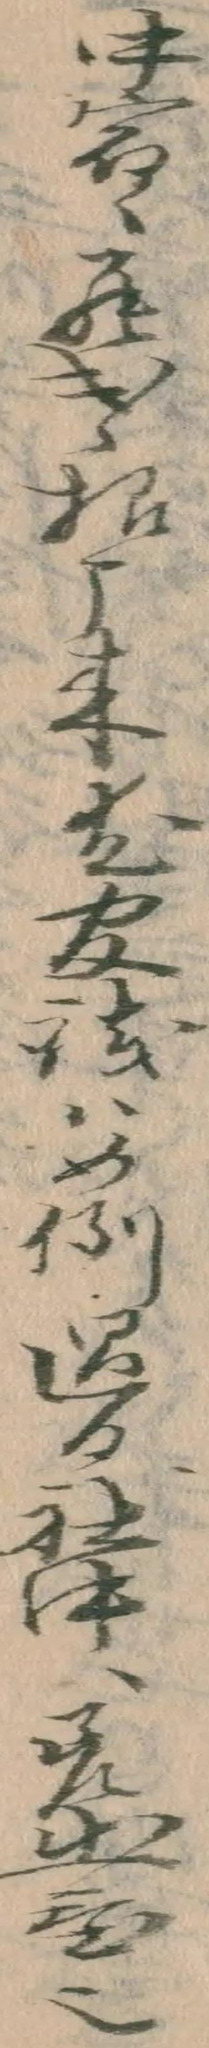中宿へ罷出候様招申来尤官銭ハ如例過日社中へ差出置也
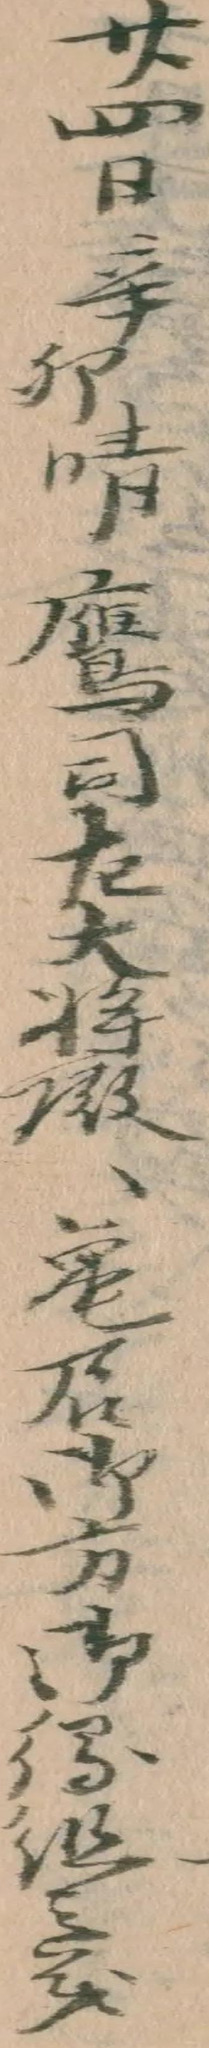廿四日辛卯晴鷹司左大将殿へ亀君御方御縁組之義
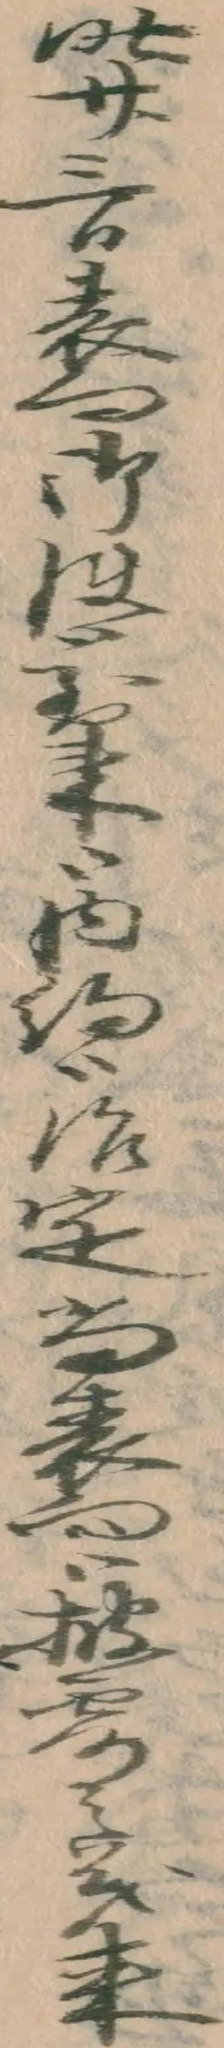昨廿三日表向御役御到来御内約御治定尚表向御披露子義来
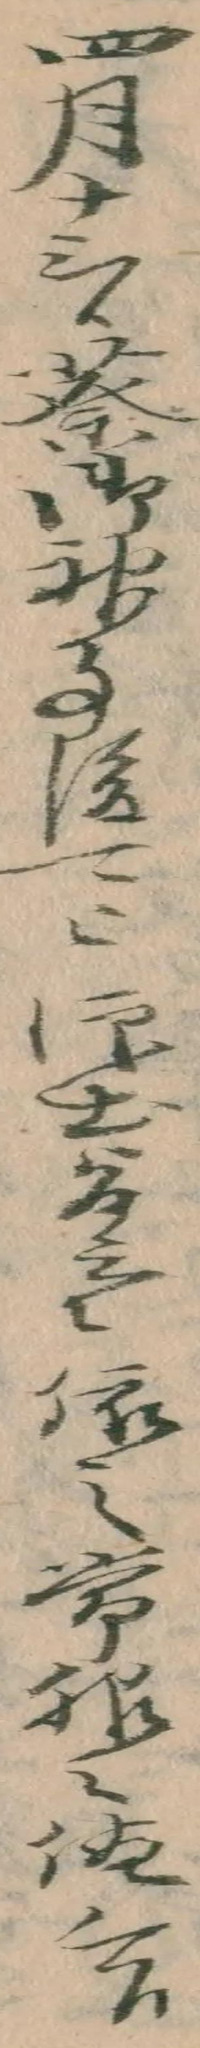四月十三日葵御神事後可被仰出旨云々依之常服之儘今日
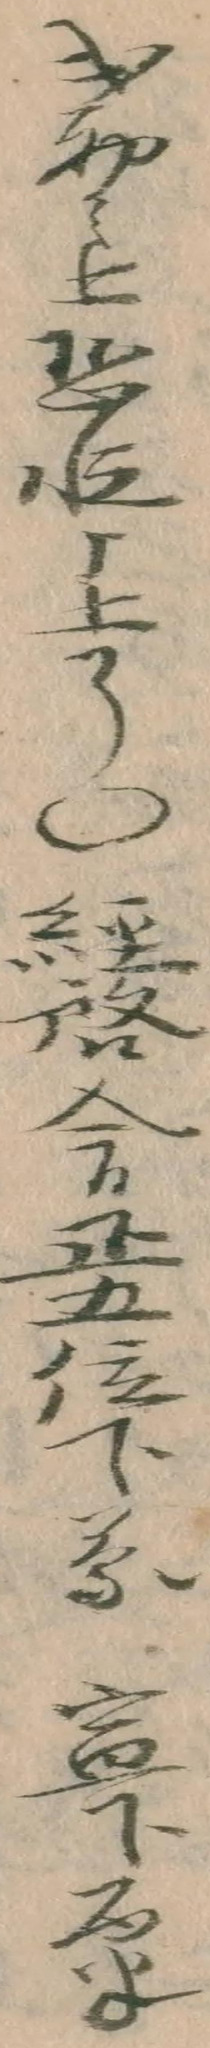出勤之上恐悦申上了○経啓今日正五位下蒙宣下酉半
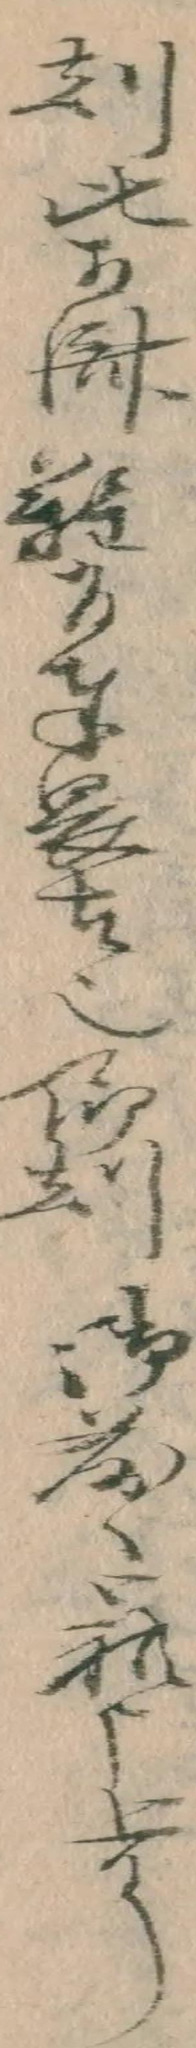刻比相済難有奉畏在也即刻御前ヘ御礼申上了
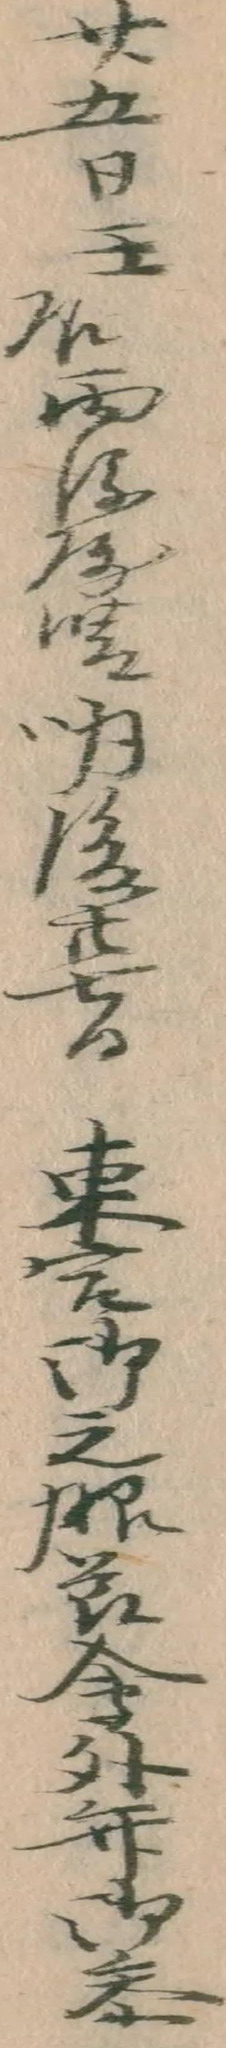廿五日壬辰雨後属晴明後廿七日東宮御元服會外弁御参
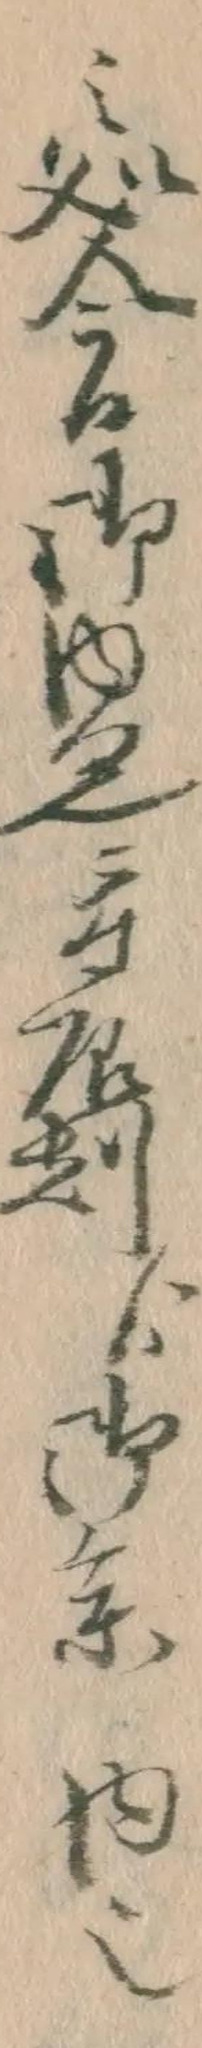之処今日御内見ニ付辰刻ゟ御参内也
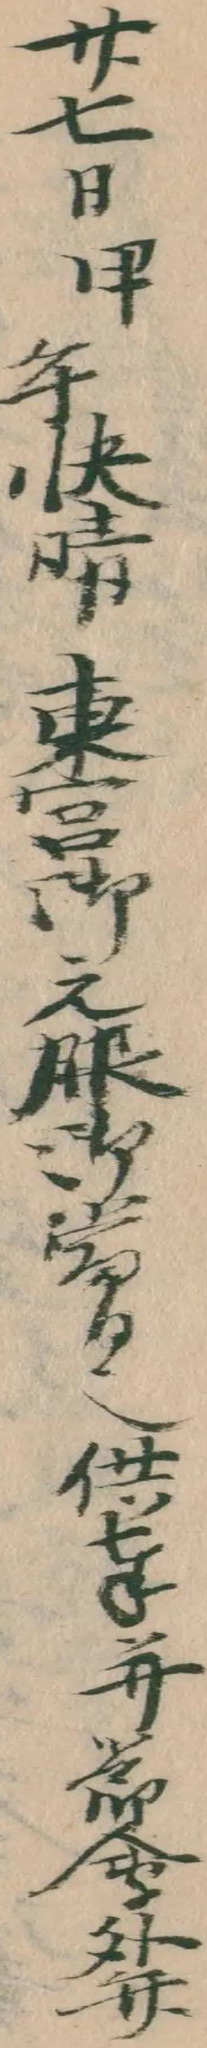廿七日申午快晴東宮御元服御當日也供奉并節會外弁
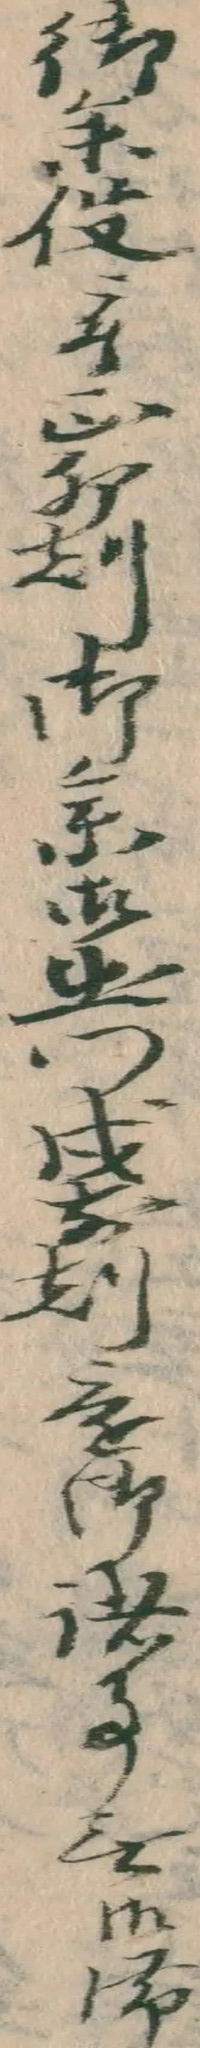御参役ニ付正卯刻御参御出門戌前刻還御諸事無御滞
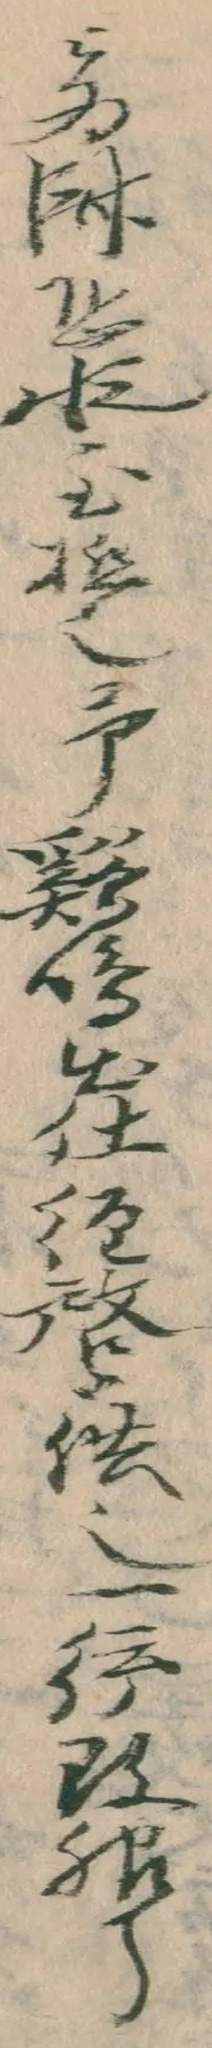被為済恐悦至極也予鶏鳴出仕経啓御供也一統改服了
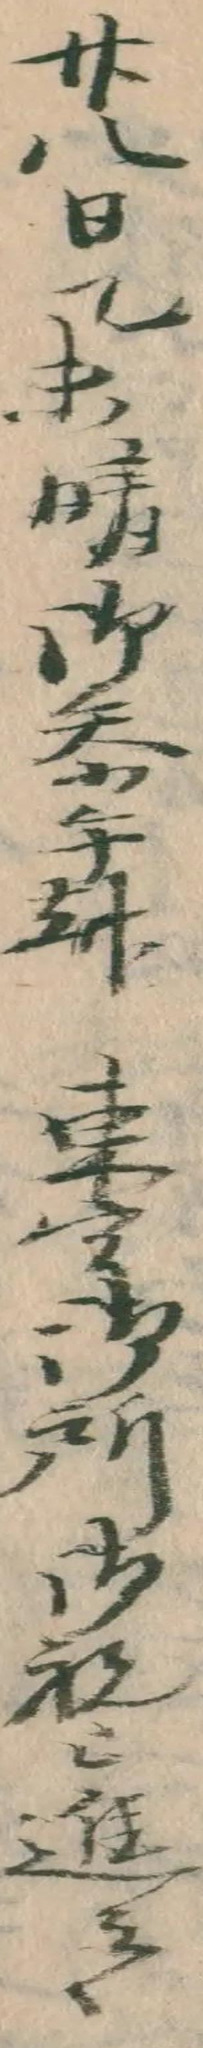廿八日乙未晴御参午刻東之御所御祝被進云々
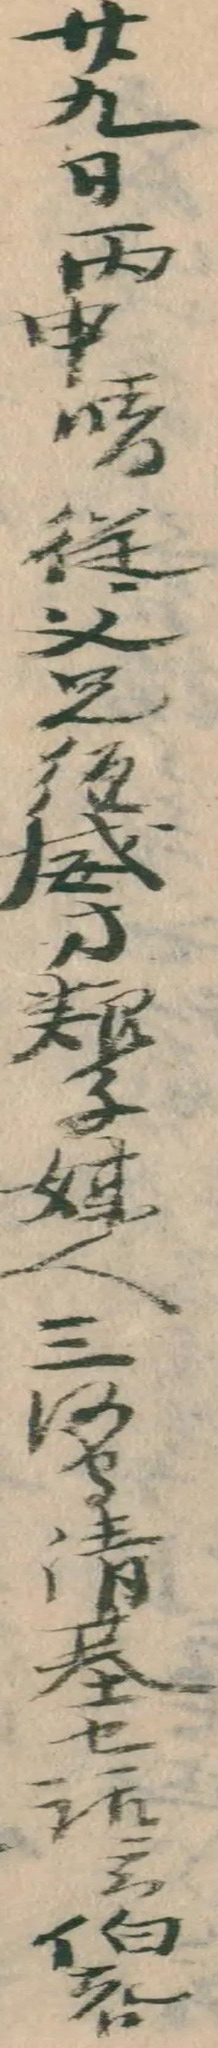廿九日丙申晴従父兄経威方養子媒人三河守清基世話ニ而伯耆
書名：賀茂社記録. 第69冊
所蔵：国立国会図書館 National Diet Library, JAPAN
